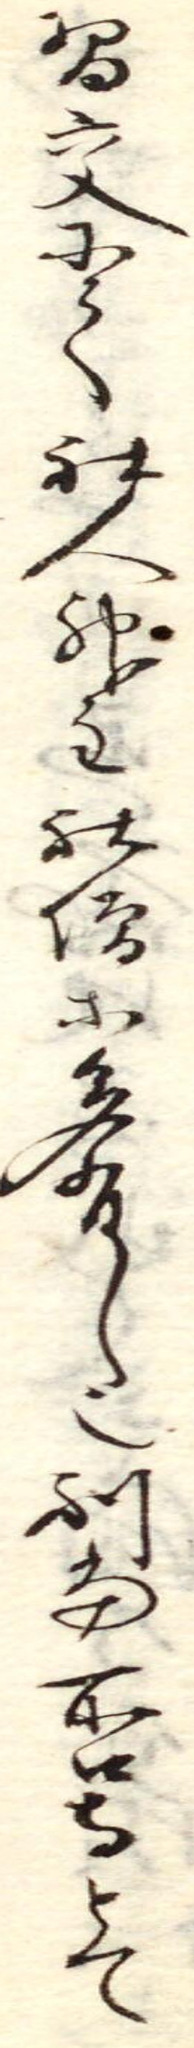習六文にて社人神主社僧等多有し也別当所口寺とて
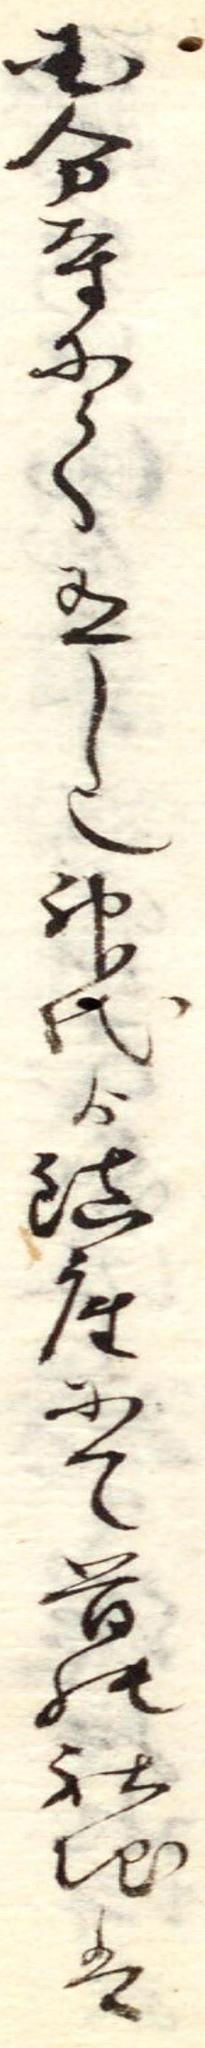国分寺にて有し也神代ゟ鎮座にて昔の社地は
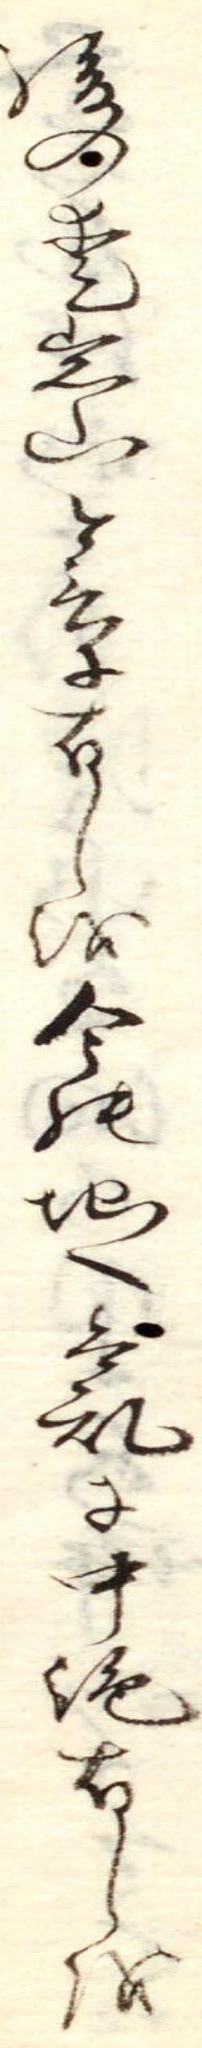後の愛岩山と云に有しを今の地へ兵乱に中絶有しを
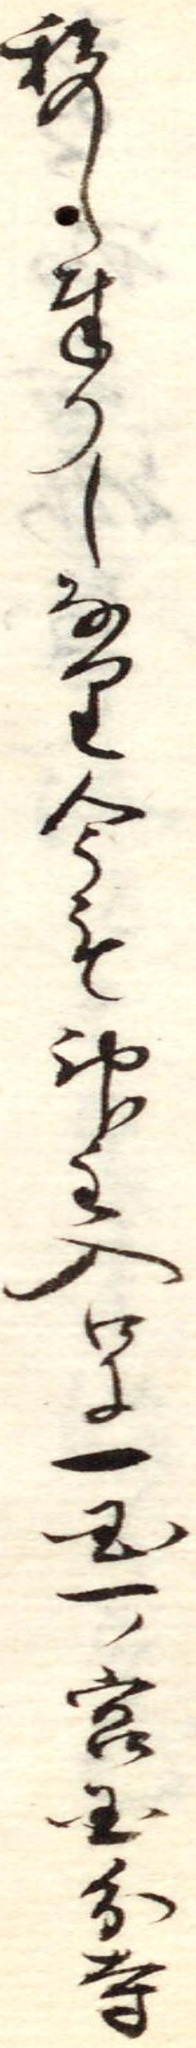移し奉りしなり今も神主入口に一国一ノ宮国分寺
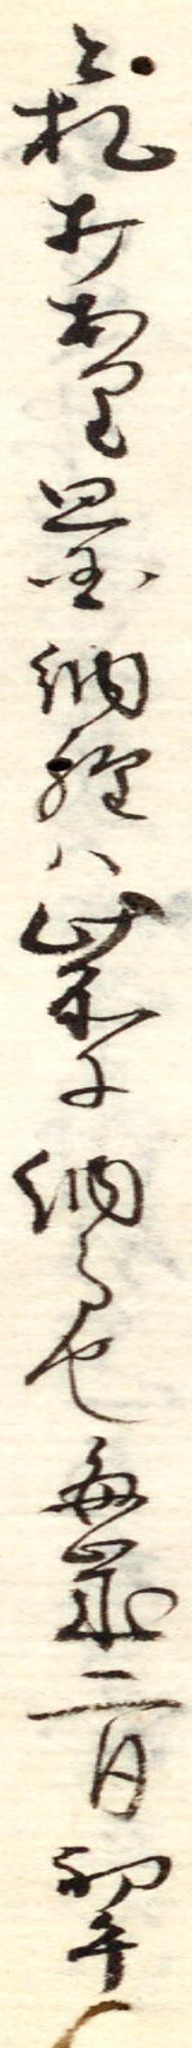と札打あり廻国納経は此所に納る也毎歳二月初午
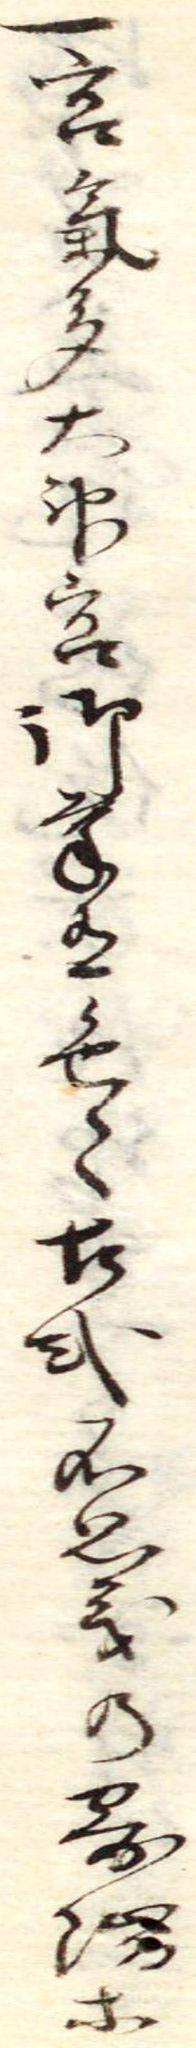一宮気多大神宮御幸有色々古式不思義の奇瑞等
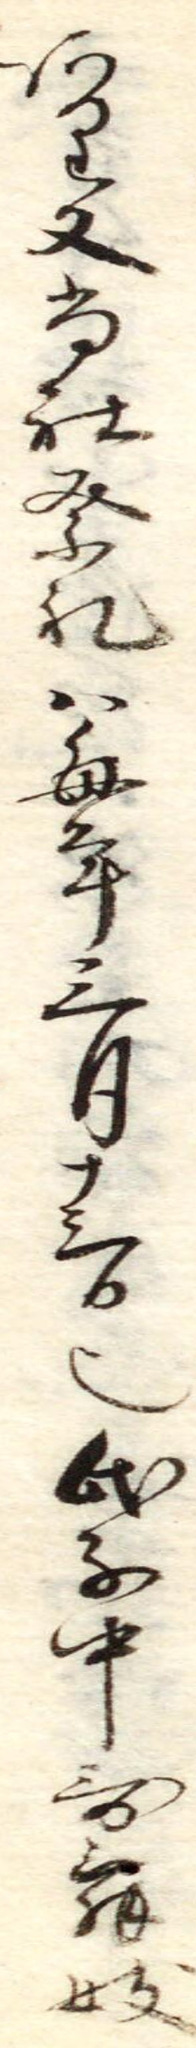あり又当社祭礼は毎年三月十三日也氏子中哥舞妓
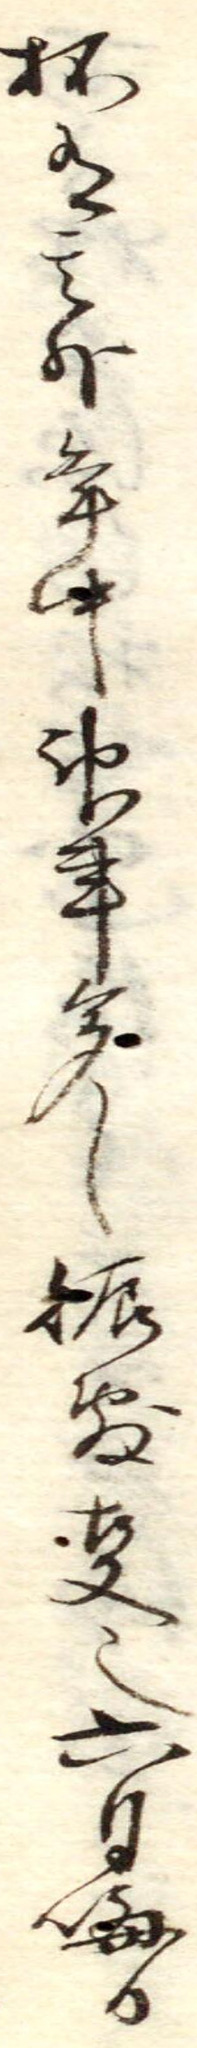抔有其外年中神事多し賑敷事也六月晦日
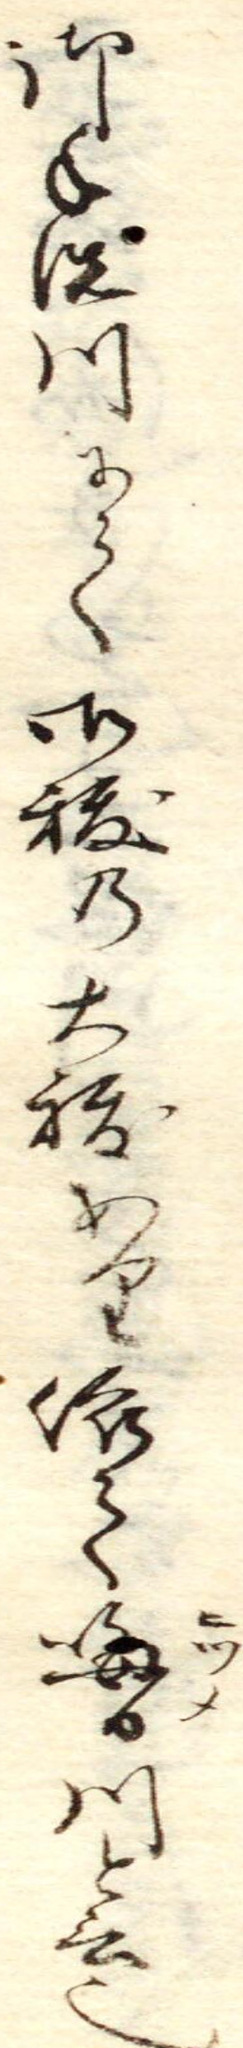御手洗川にて御祓の大祓あり依て晦日川と云也

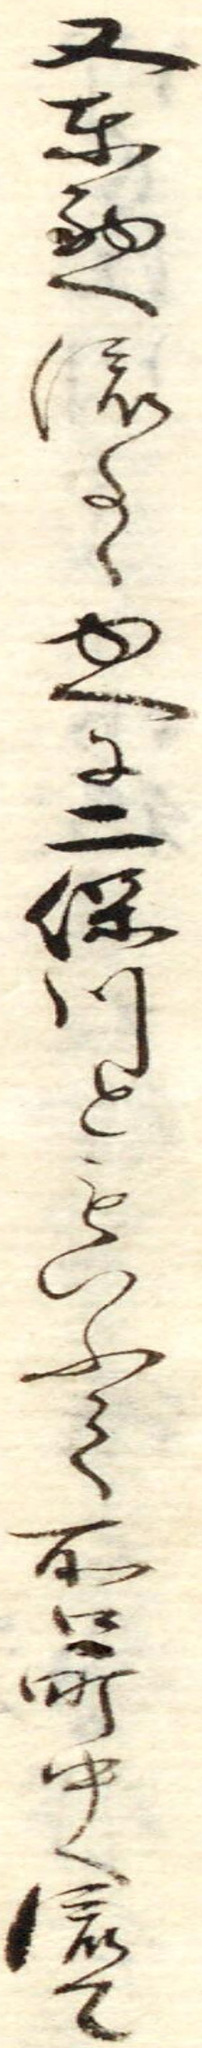又東西へ流るゝゆへに二保川ともいふて所口町へ流て
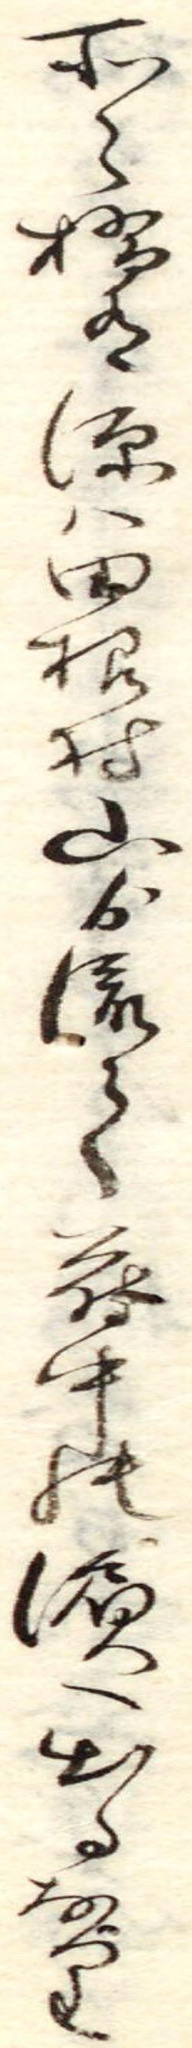所々橋有源は田根村山ゟ流て府中のは浜へ出るなり
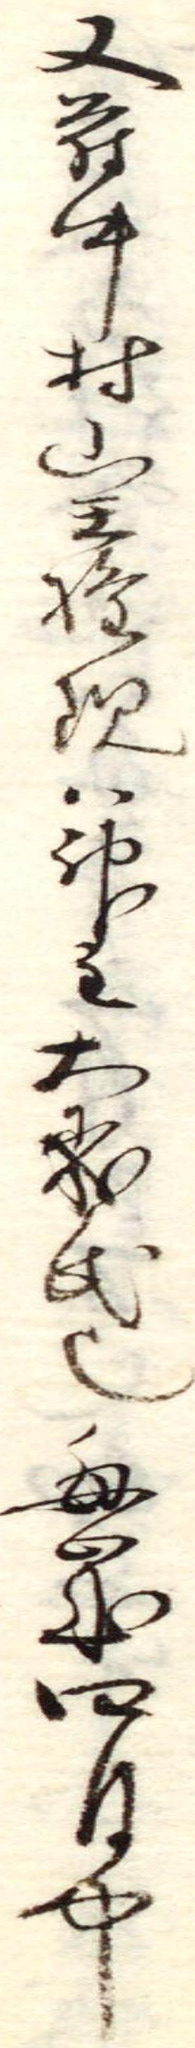又府中村山王権現は神主大森氏也毎歳四月中
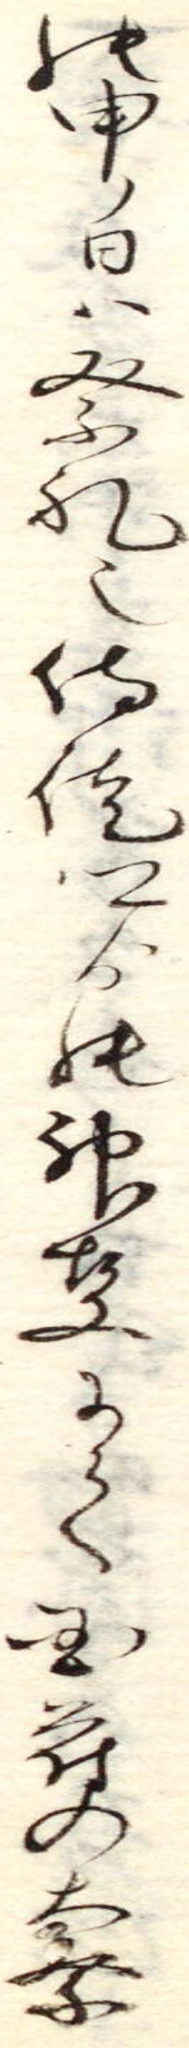に申ノ日は祭礼也侍従卿ゟ神事にて国府の大祭
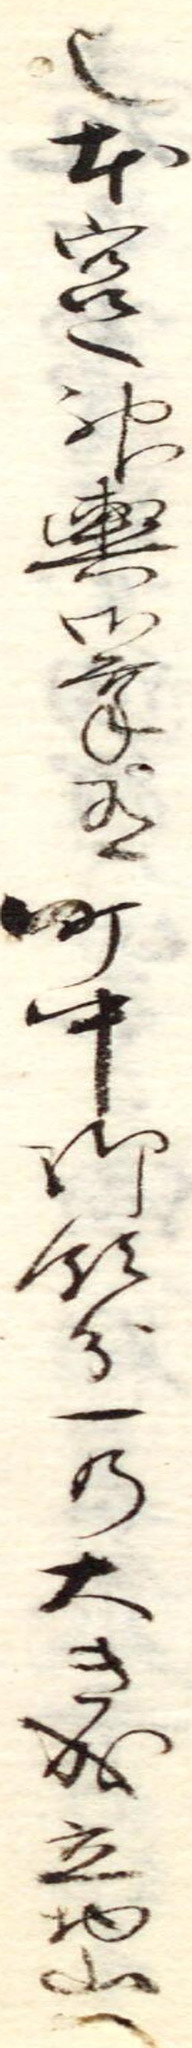也本宮へ神輿御幸有町中御領分一の大き成立物山
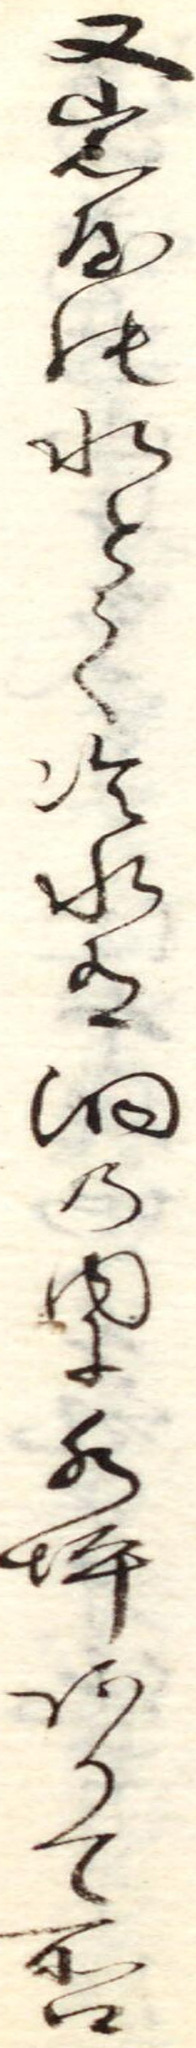又岩屋の水とて冷水有洞の内に水坪ありて所口
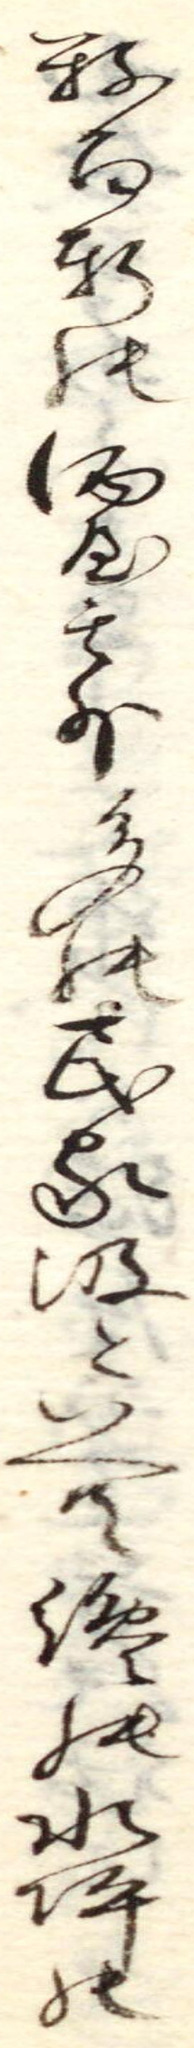数百軒の酒屋其外多の民家汲といへ共纔の水坪の
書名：能登名跡誌
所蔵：Ishikawa Prefectural Library
